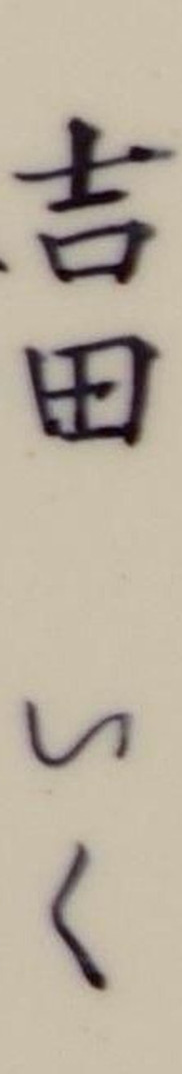吉田いく
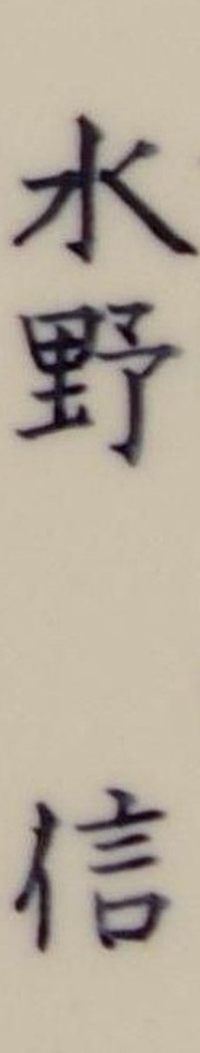水野信
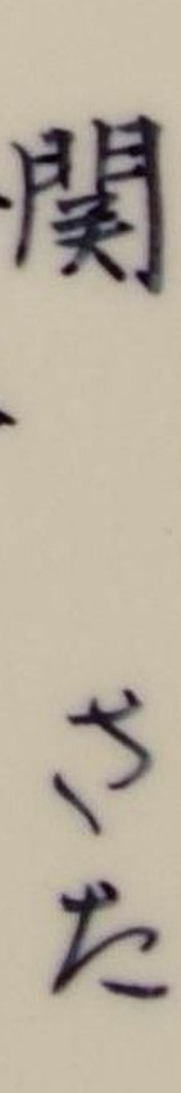関さた
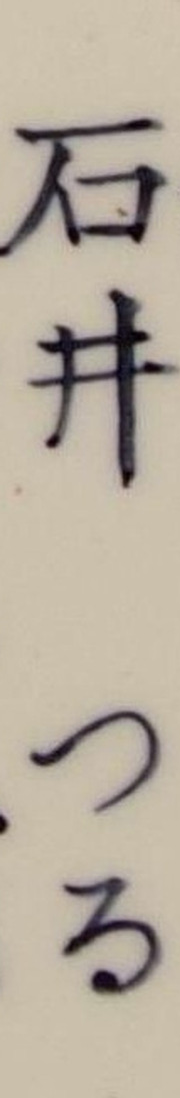石井つる
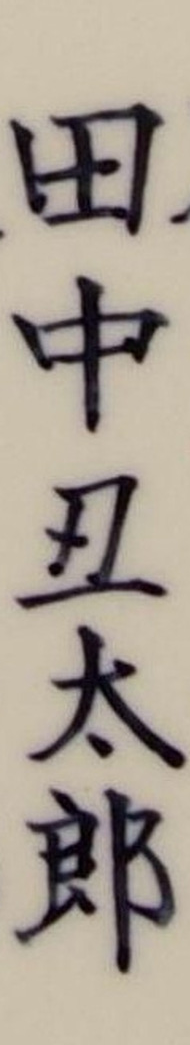田中丑太郎
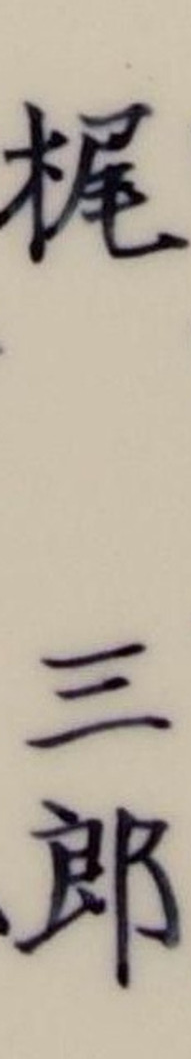梶三郎
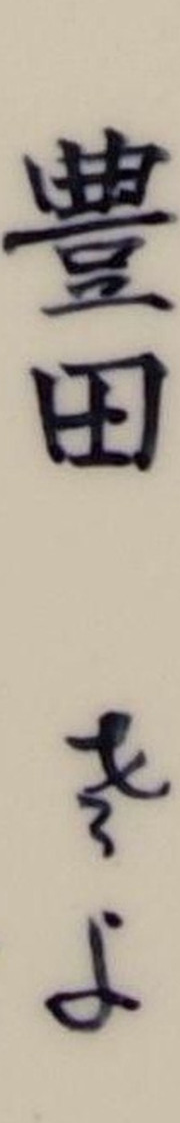豊田さよ
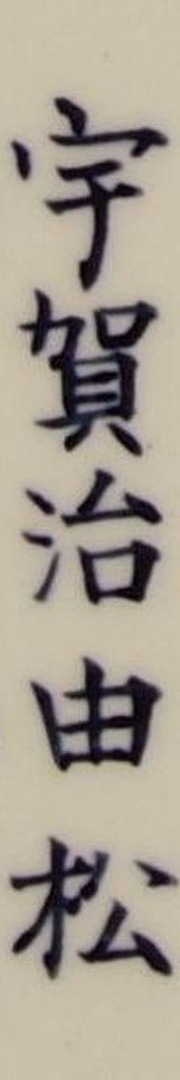宇賀治由松
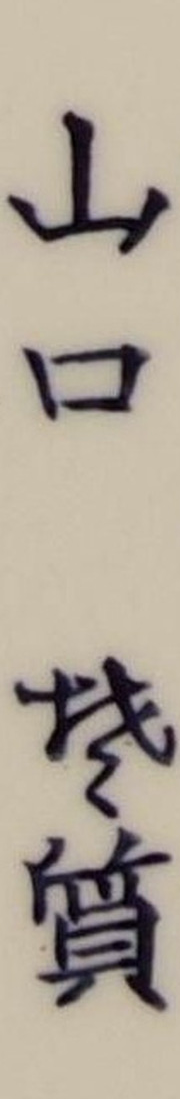山口越質
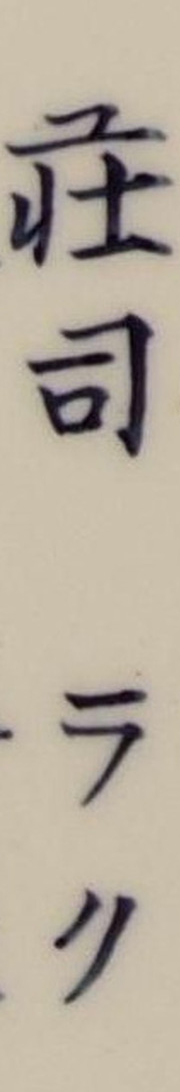荘司ラク
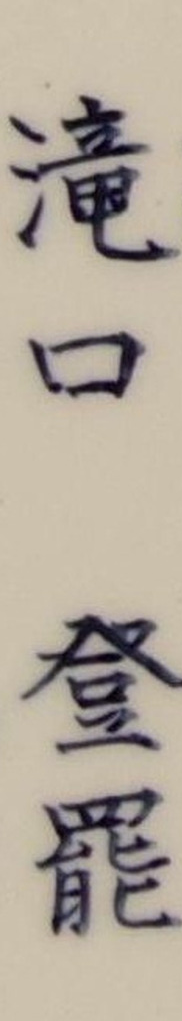滝口登罷
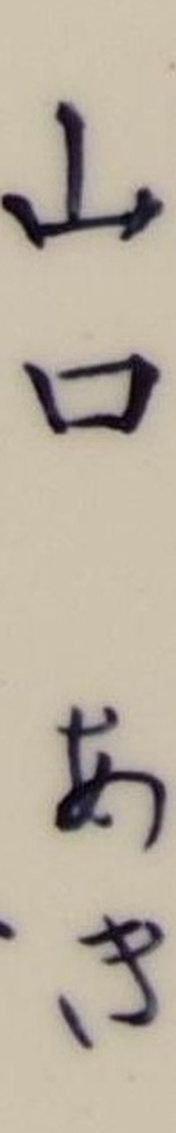山口あき
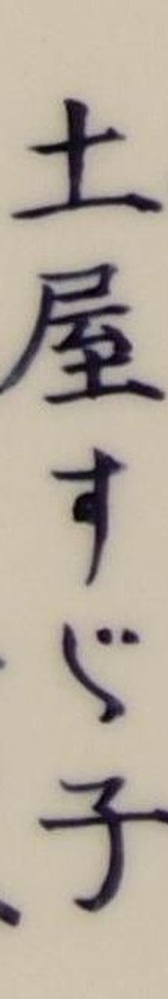土屋すゞ子
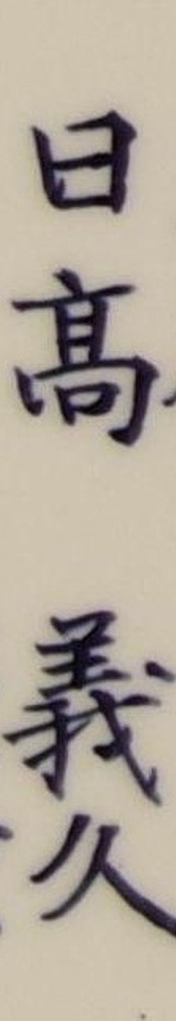日高義久

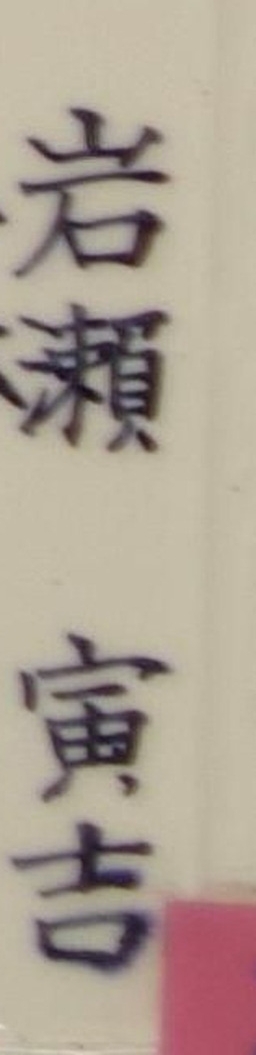岩瀬寅吉
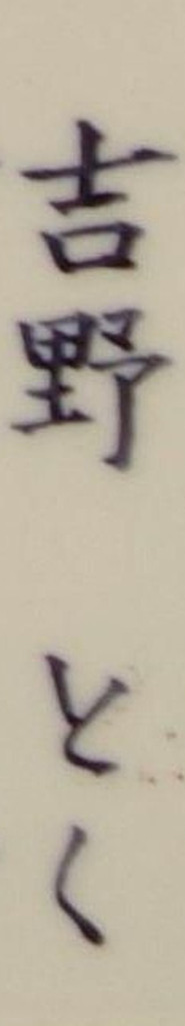吉野とく
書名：M~S
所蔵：高野山金剛峯寺
